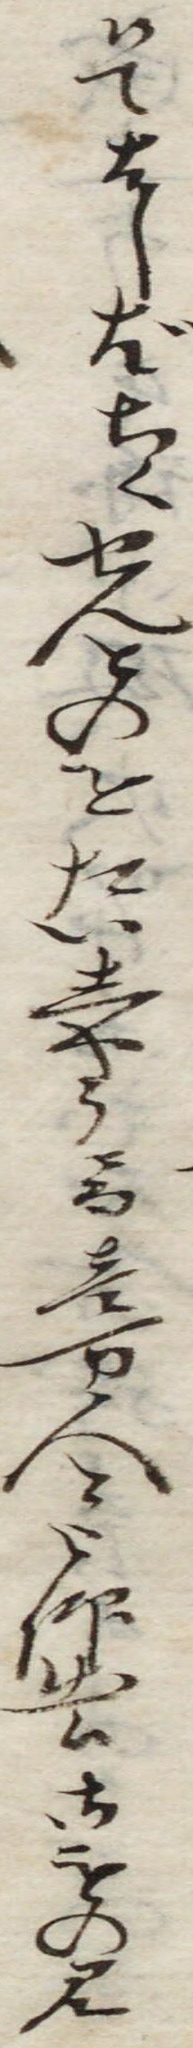候てはしばちくせんとのをたいしやうに而壱万人と被仰出候御もの見
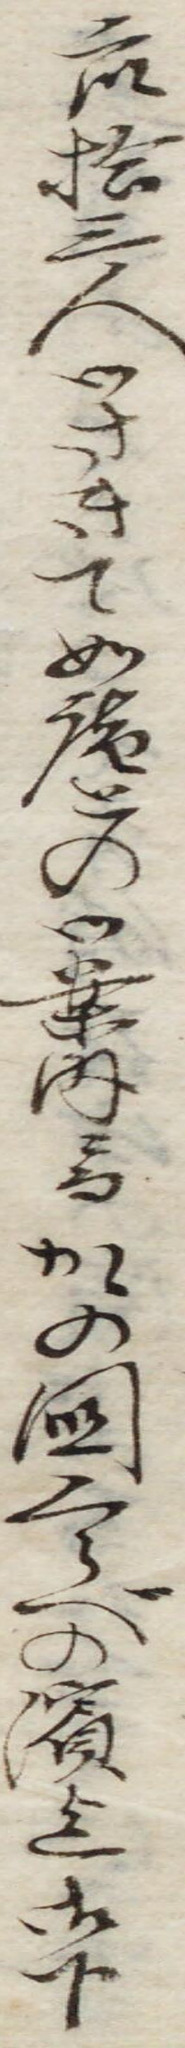衆拾三人御さきて如庵との御案内に而かゝの国くらべの浜迄御下
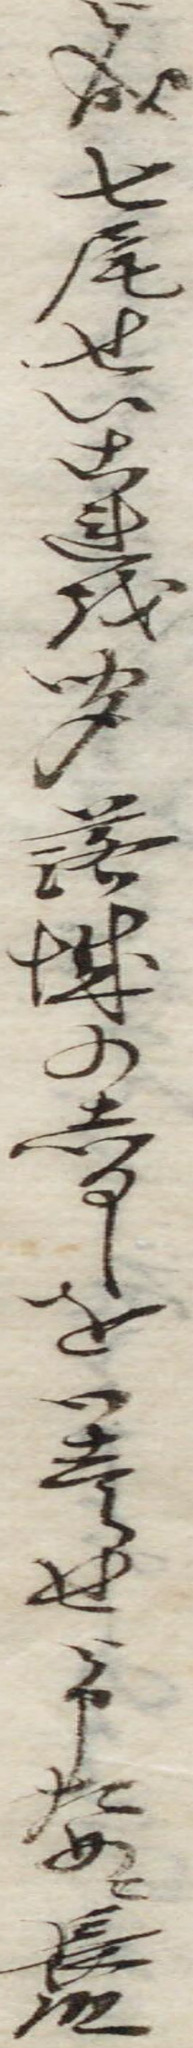被成七尾せいこれを聞落城のしるしを御しらせ被申ために長殿
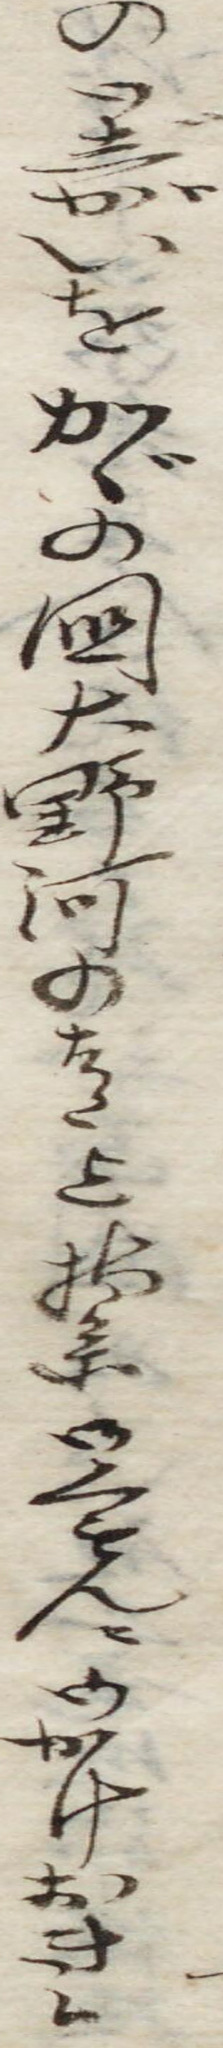の御じがいをかゞの国大野河のはた迄持参御くもんに御かけおき候
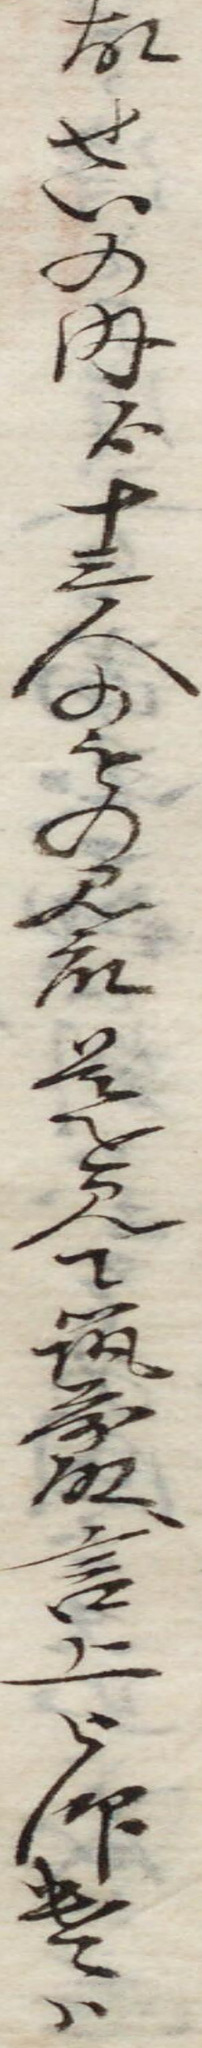故せいの内ゟ十三人のもの見衆是を見て筑前殿へ言上被仰遣候は
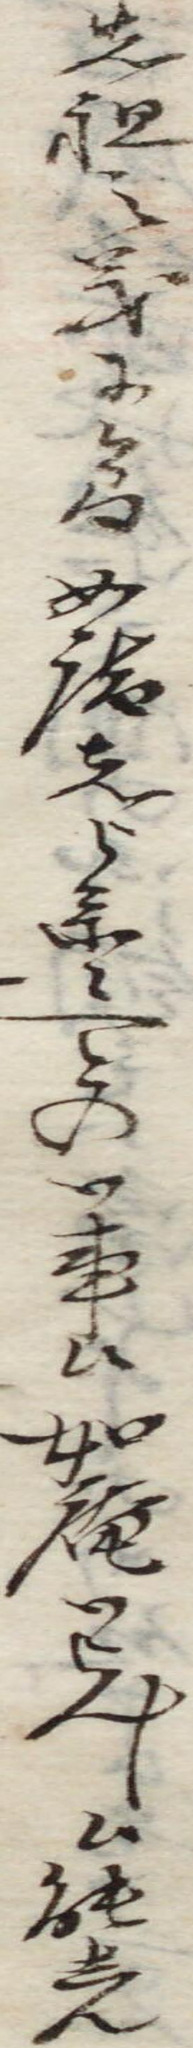先祖之義に候間如庵先被参候へとの御事候如庵御被聞候能しん
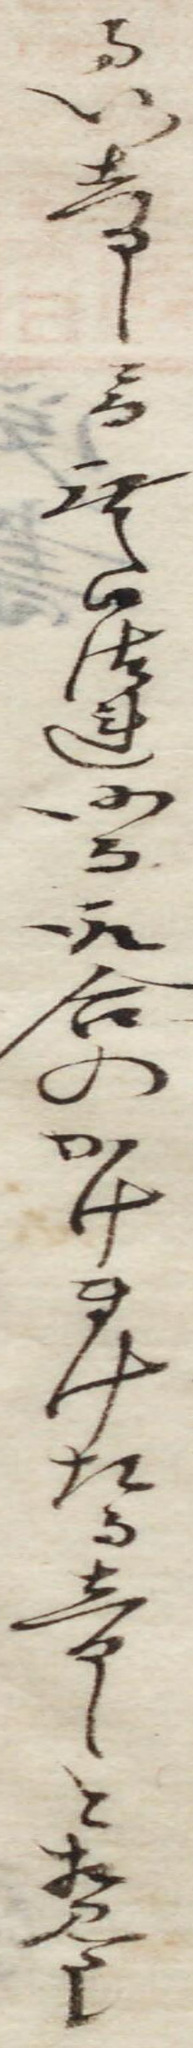るいノしるしに而無之候つれ仍而取合のかけまけたるしるしと相見申
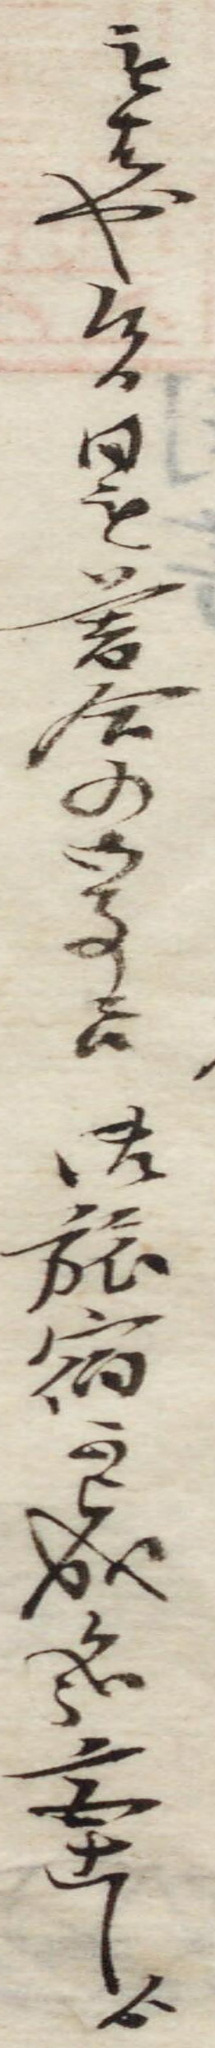もはや今日ひも暮合の御事に候御旅宿可被成候哉宮こしゟ
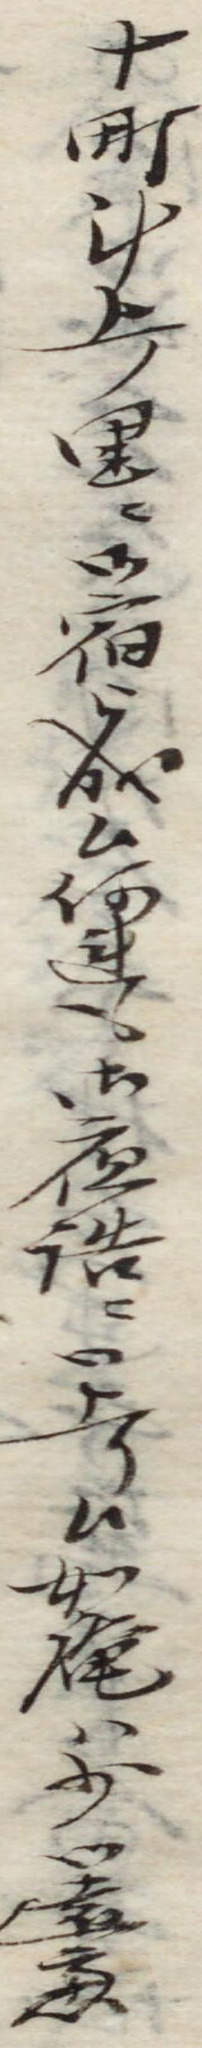十町斗上ノ里に御宿被成候何れも御夜詰に御上り候如庵は少御遠慮
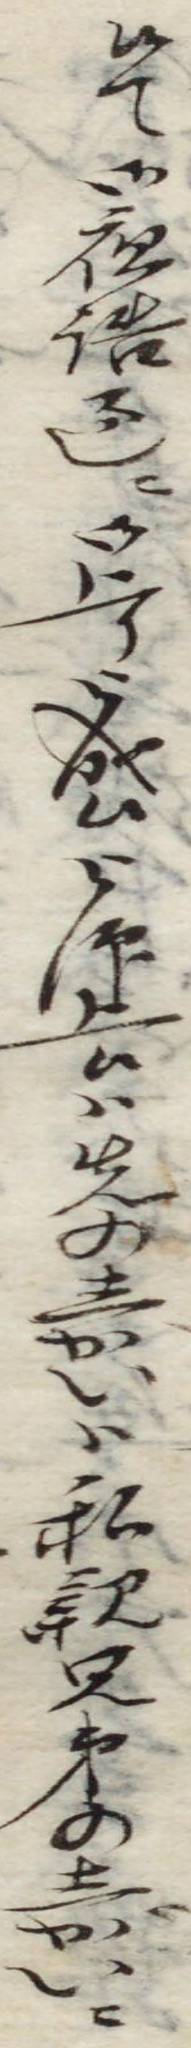候て御夜詰過に御上り被成候被仰上候は先のしがいは私親兄弟のしがいに
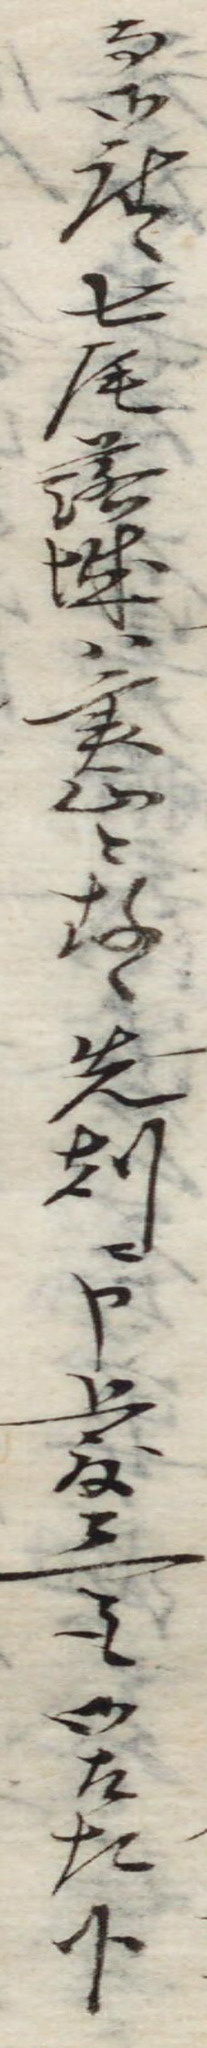而御座候七尾落城は実正と存候先刻に申上度候へとも御た下
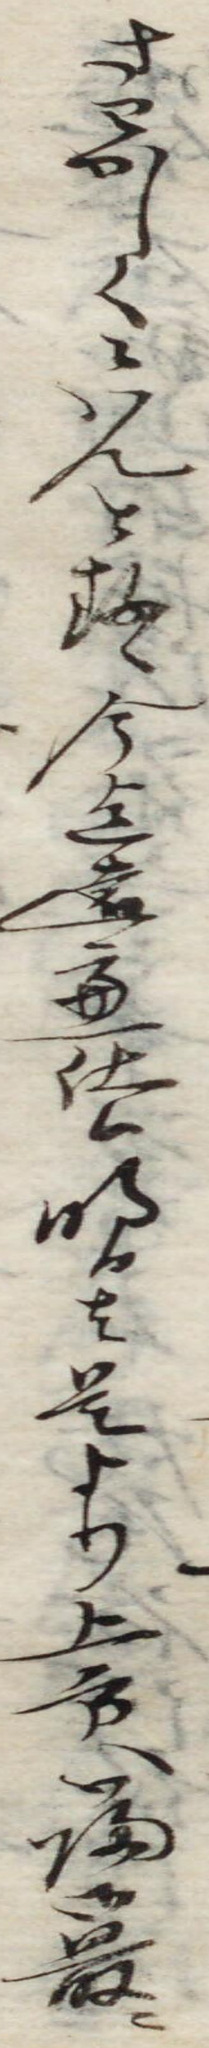さわかしく候はんと存候今迄遠慮仕候明日は是より上方へ御帰御最に
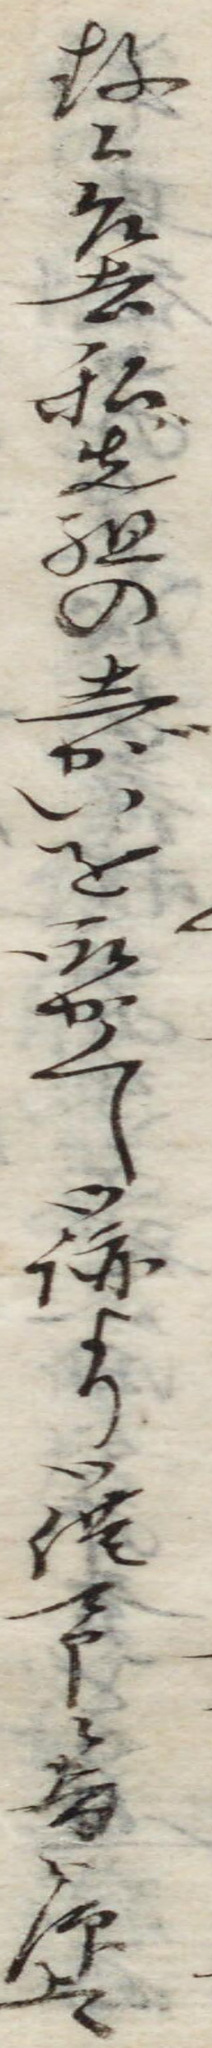存候乍去私先祖のしがいを取かくし御跡より御供可申候旨被仰上候
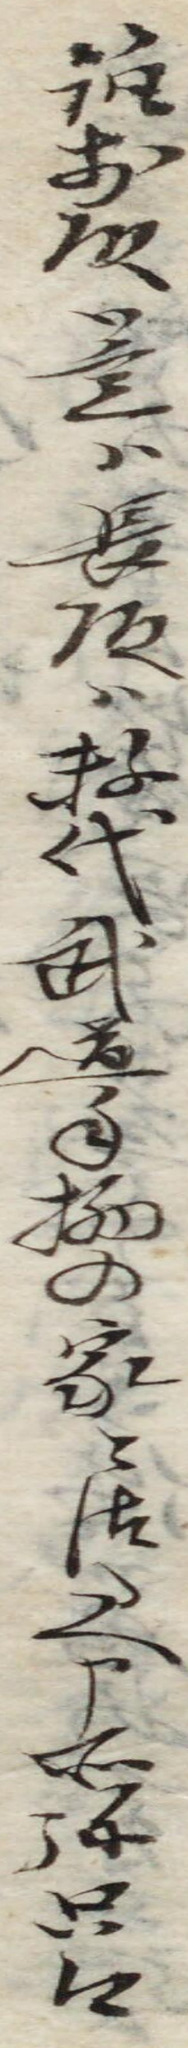築前殿御意は長殿は数代武道手柄の家とつたへ申所弥只今
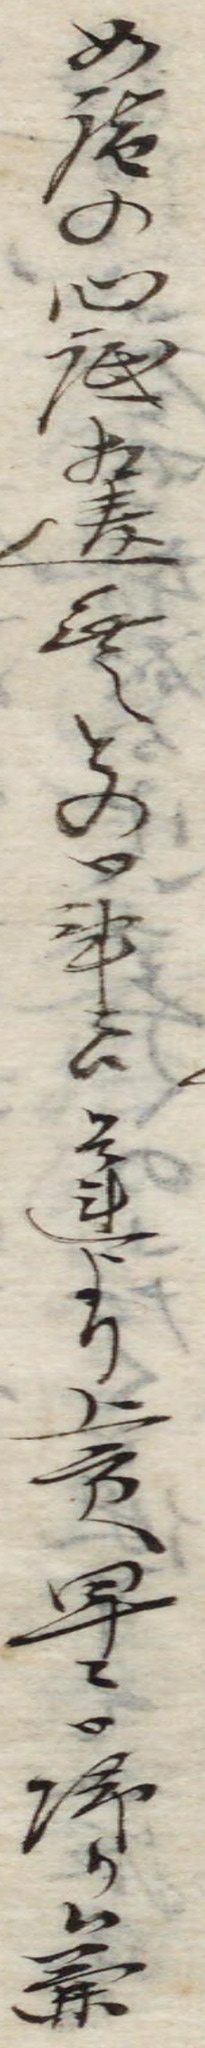如庵の心底相違無之との御事に候それより上方へ早々御帰り候兼
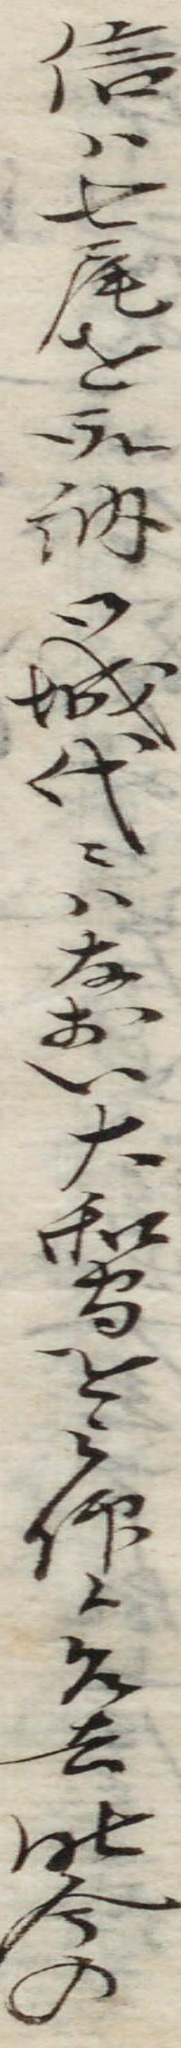信は七尾を取納御城代にはなおい大和守を被仰候乍去昨今の
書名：古老紀談等
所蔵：Ishikawa Prefectural Library
